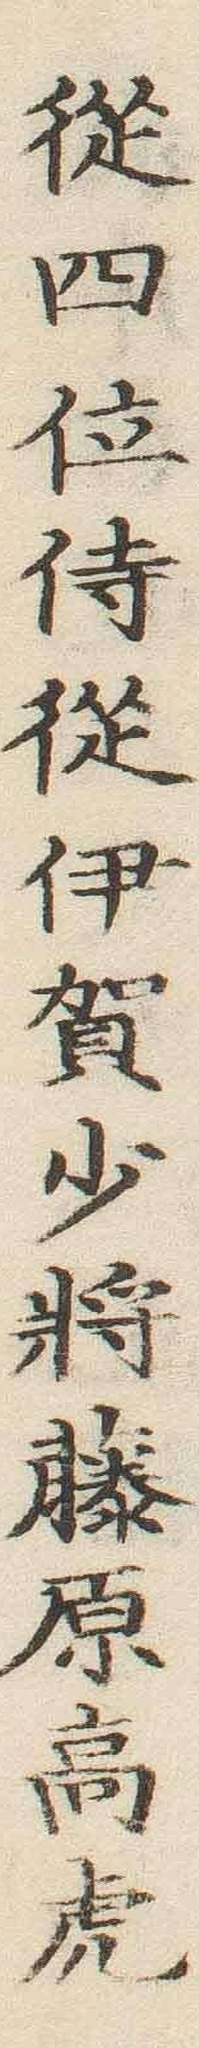從四位侍從伊賀少將藤原高虎
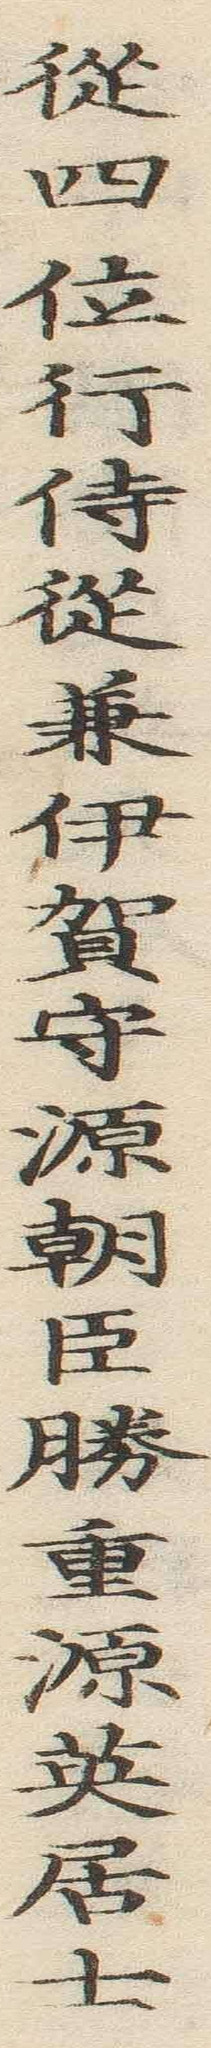從四位行侍從兼伊賀守源朝臣勝重源英居士
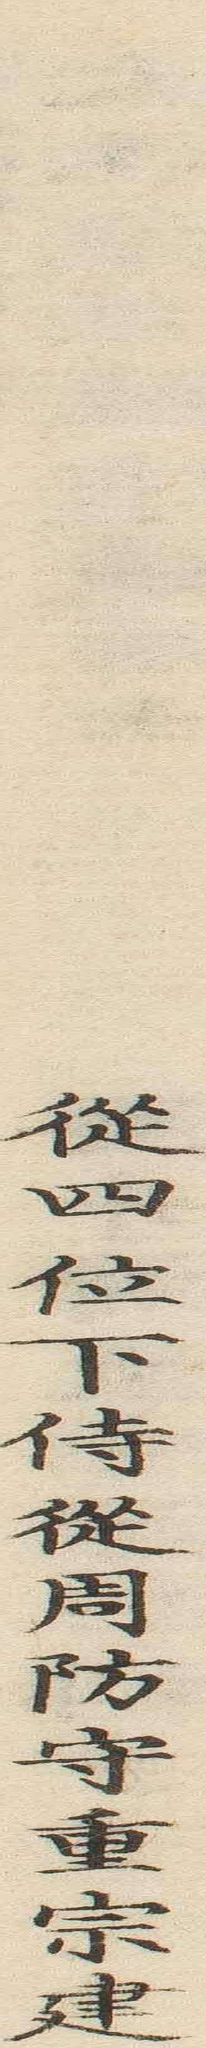從四位下侍從周防守重宗建
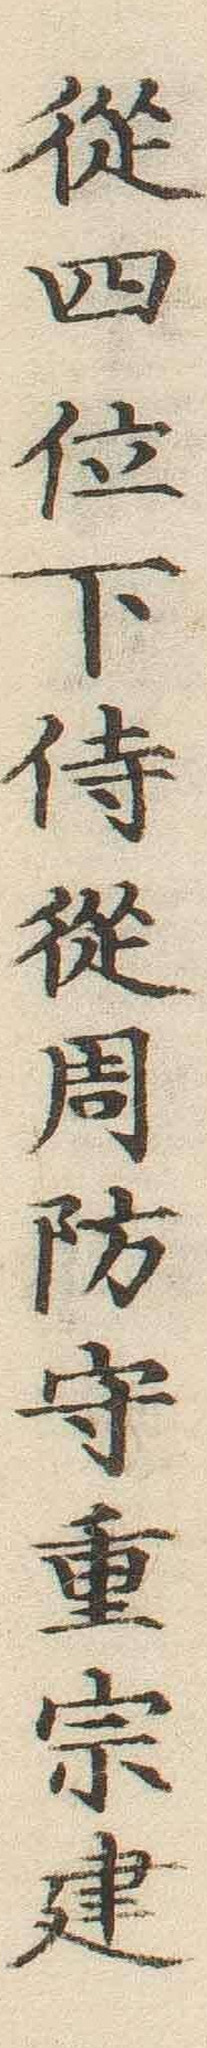從四位下侍從周防守重宗建
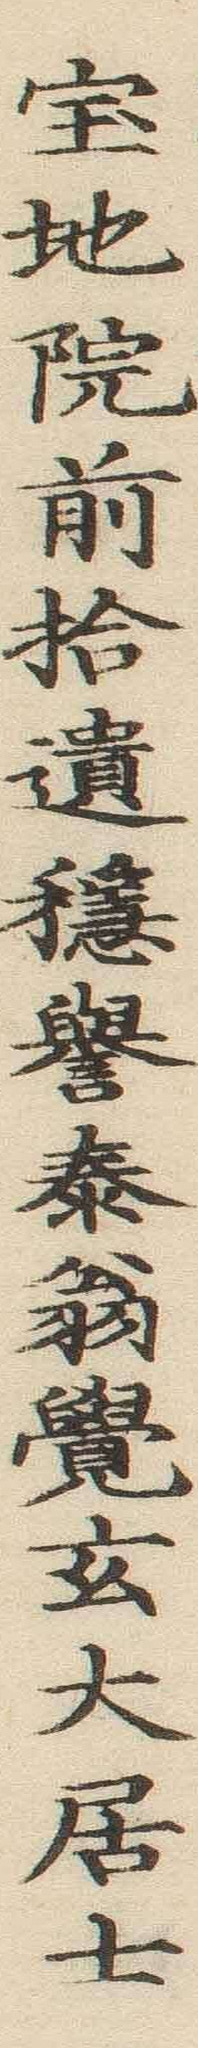宝地院前拾遺穩譽泰翁覺玄大居士

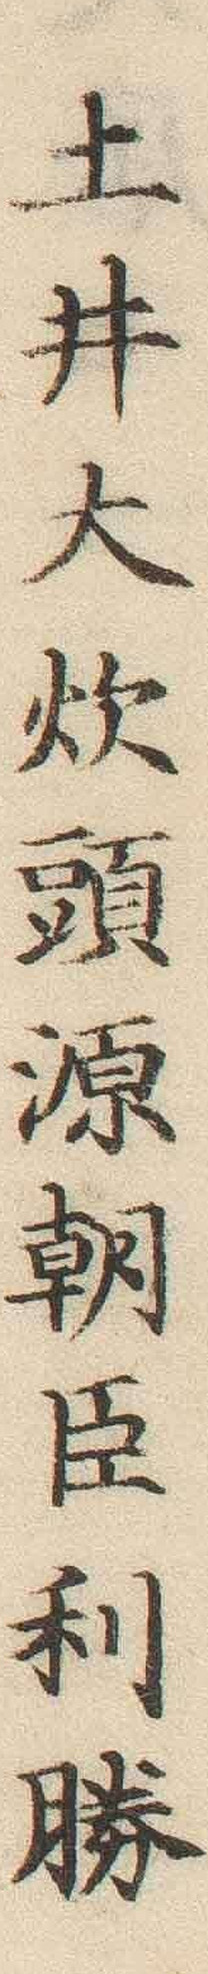土井大炊頭源朝臣利勝
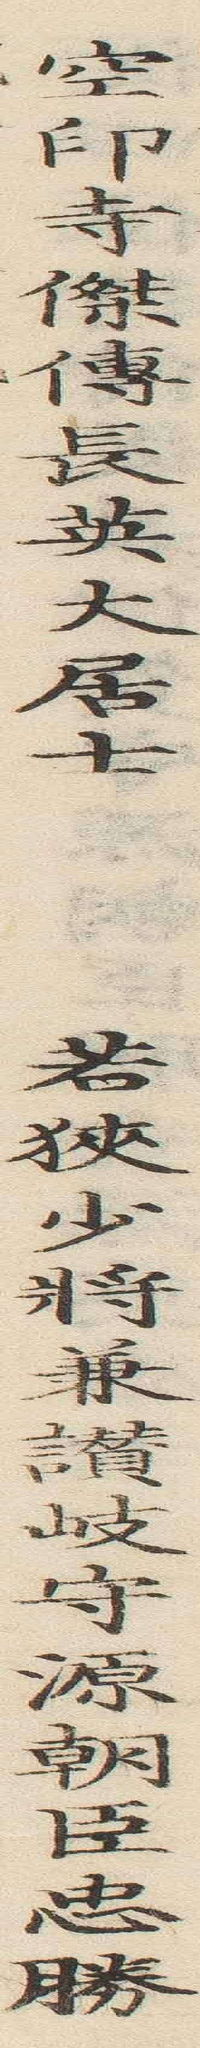空印寺傑傳長英大居士若狹少將兼讃岐守源朝臣忠勝
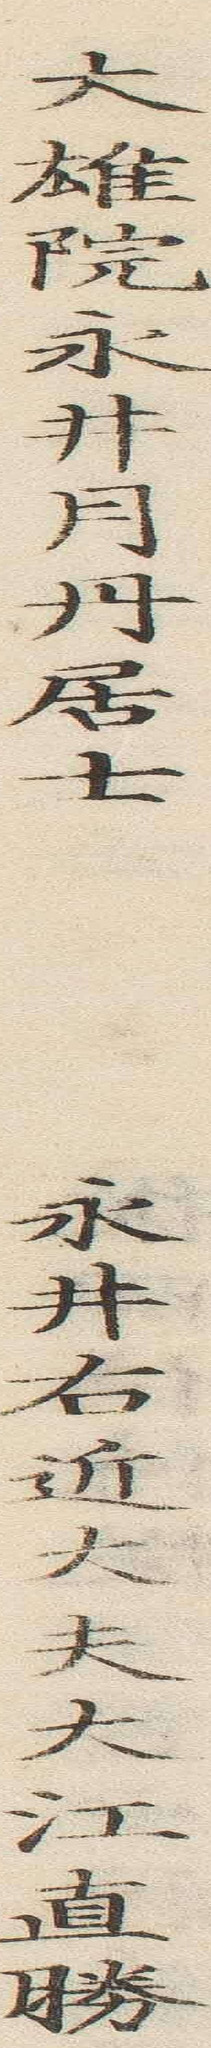大雄院永井月丹居士永井右近大夫大江直勝
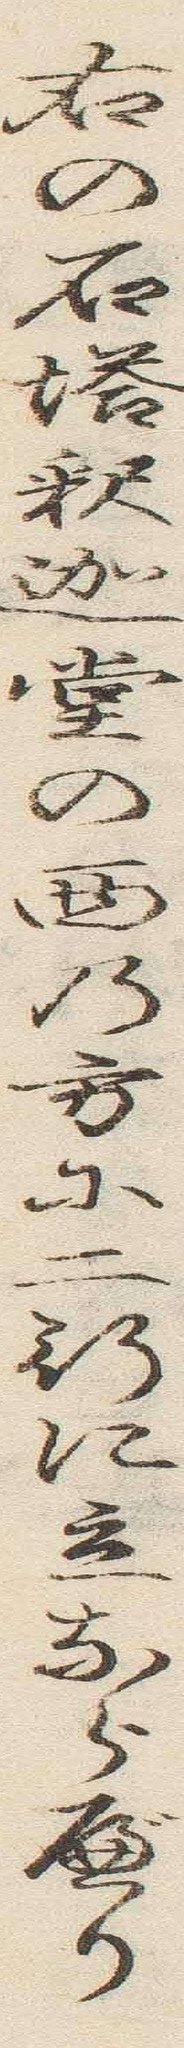右の石塔釈迦堂の西の方に二行に立ならべり
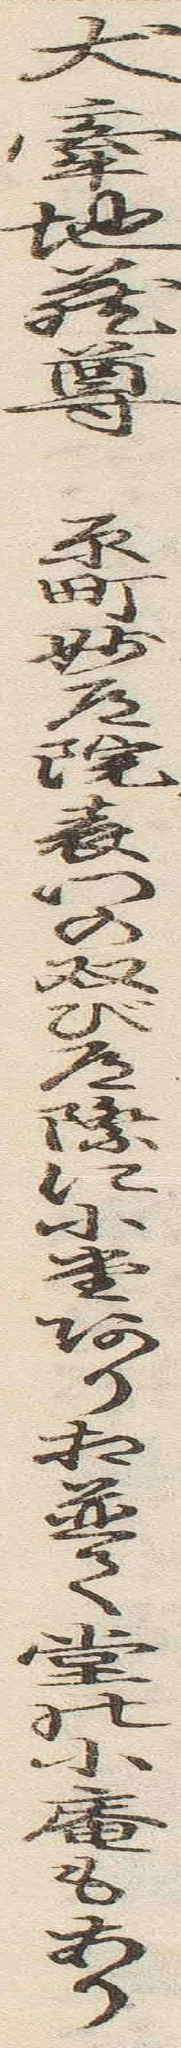犬牽地蔵尊原町妙道院表門の双び道際に小堂あり相並て堂の小庵もあり
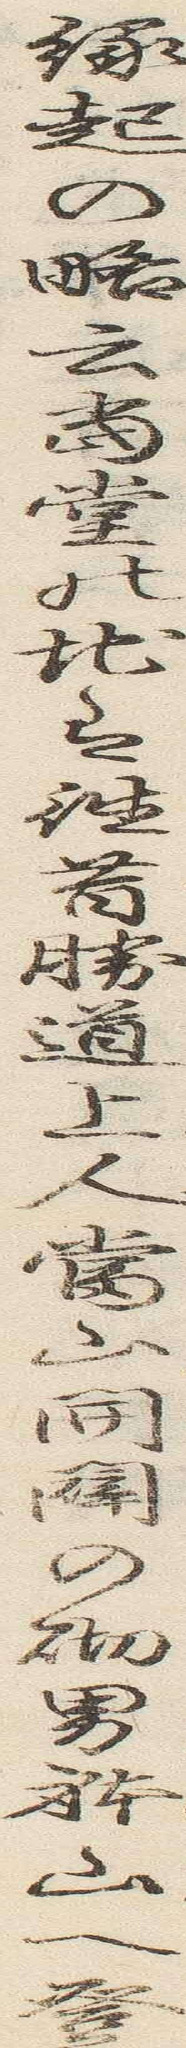縁起の略云當堂の地は徃昔勝道上人當山開闢の砌男躰山へ登
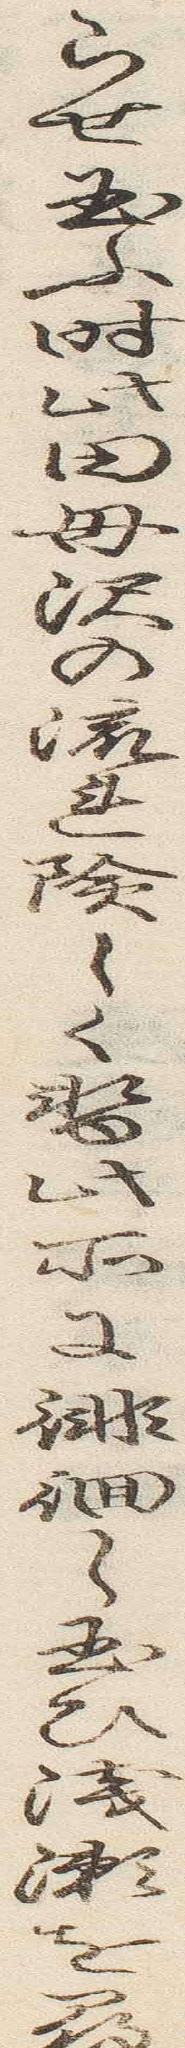らせ玉ふ时此田母沢の流れ険しく暫此所に徘徊し玉ひ浅瀬を尋
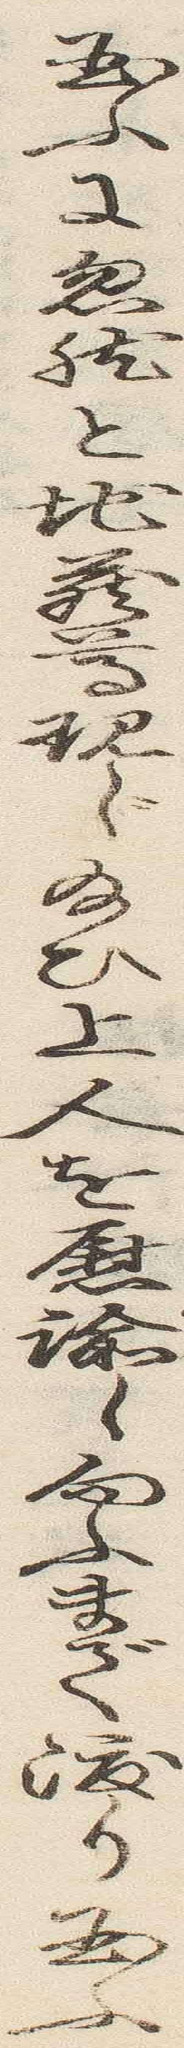玉ふに忽然と地蔵尊現じ給ひ上人慰諭し向ふまで渡り玉ふ
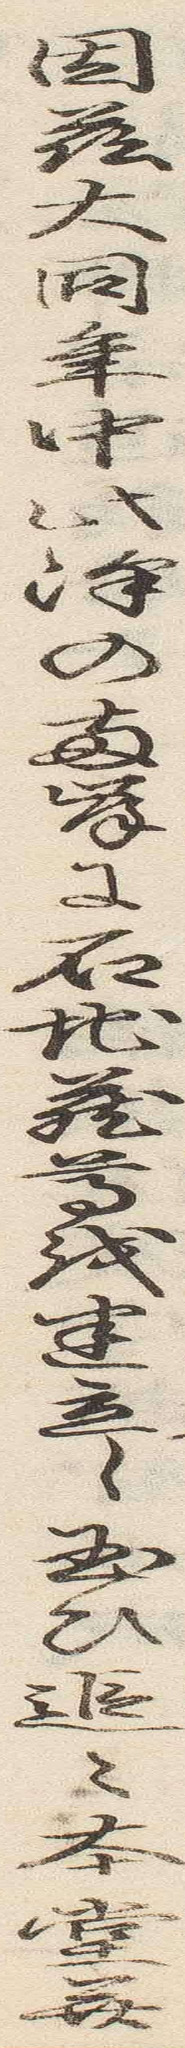因兹大同年中此澤の両岸に石地蔵尊を建立し玉ひ追〻本堂并
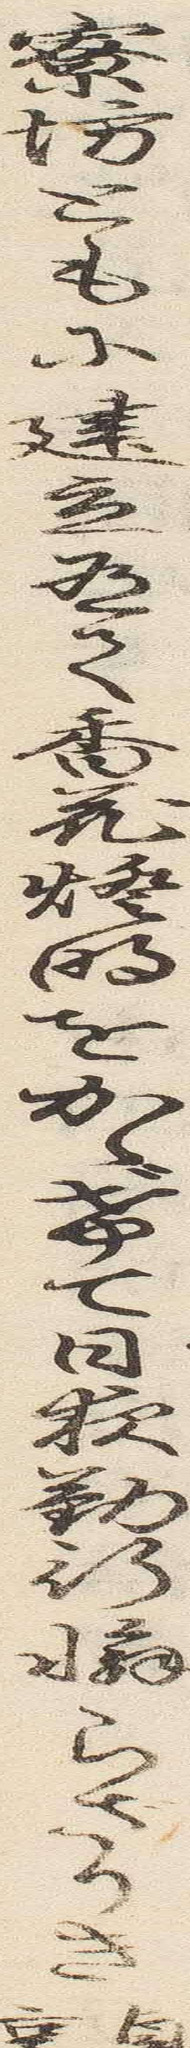寮坊ともに建立有て香花燈明をかゝげて日夜勤行懈らざりき貞享
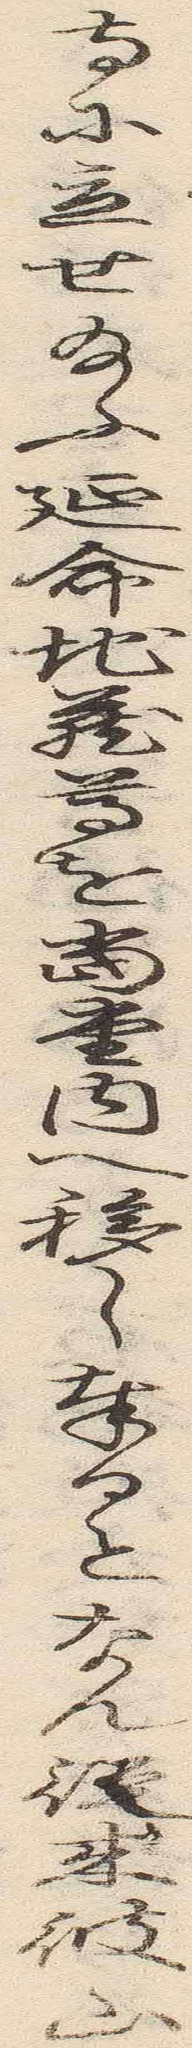寺に立せ給ふ延命地蔵尊を當堂内へ移し奉るとなん従來彼山
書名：日光山志
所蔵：東京学芸大学附属図書館 国文学研究資料館
